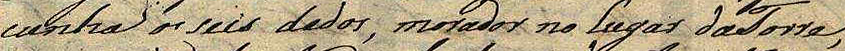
cunha os seis dedos, morador no Lugar da Torre,
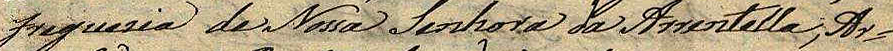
freguesia de Nossa Senhora da Arrentella, Ar
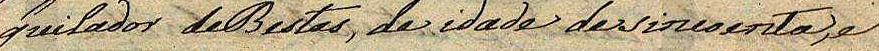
quilador de Bestas, da idade de sincoenta, e
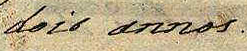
dois annos.
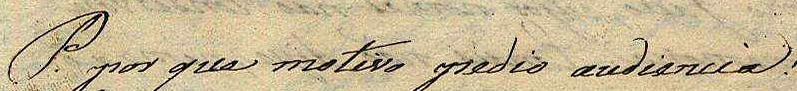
P. porque motivo pedio audiencia.
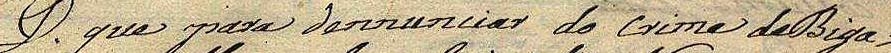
D. que para dennunciar do crime de Biga-
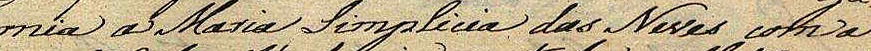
mia a Maria Simplicia das Neves com a
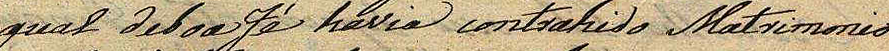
qual de boa fé havia contrahido Matrimonio
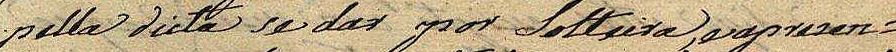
pella dicta se dar por Solteira, e apresen
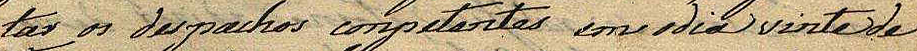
tar os despachos competentes em o dia vinte de
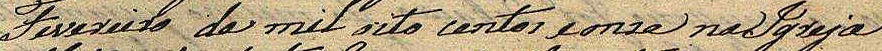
Fevereiro de mil oito centos e onze na Igreja
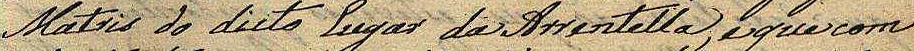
Matris do dicto Lugar da Arrentella, e que com
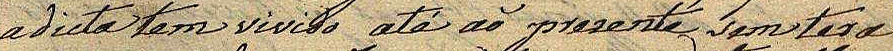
a dicta tem vivido até aõ prezente sem ter a
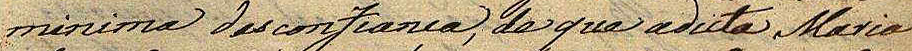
minima desconfiança, de que a dicta Maria
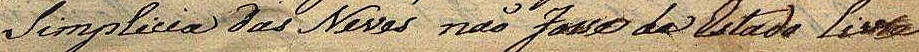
Simplicia da Neves naõ fosse de Estado Livre
